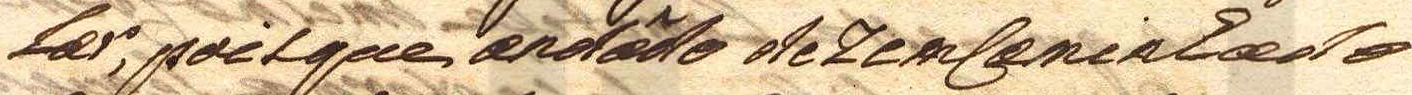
lar, pois que andādo dezemCaminhado
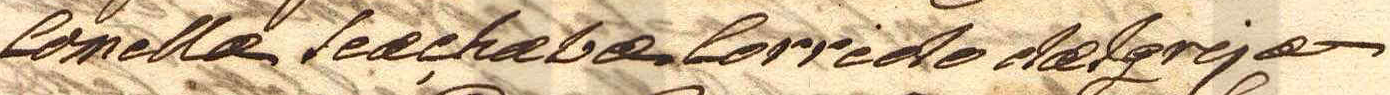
Com ella se açhava Corrido da Igreja
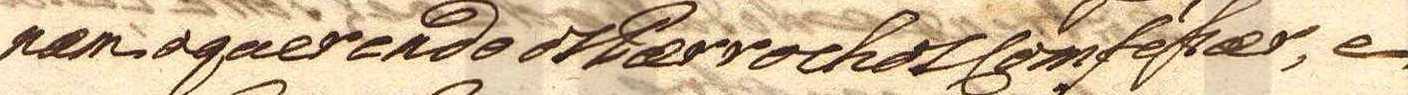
nam a querendo os Parrochos Comfessar, e
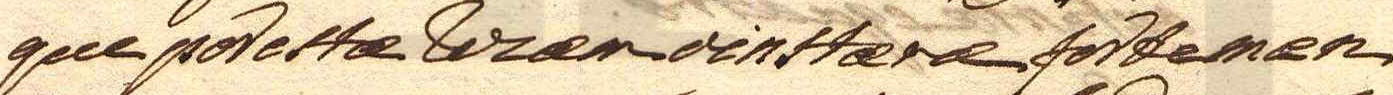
que por esta Rezam o instara fortemen
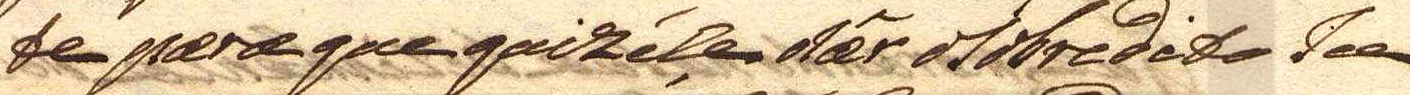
te para que quizéÇe dâr o sobredito Iu
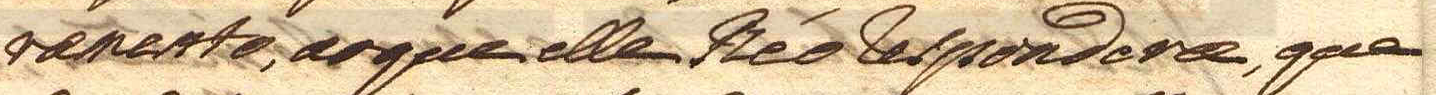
ramento, ao que elle Réo Respondera, que
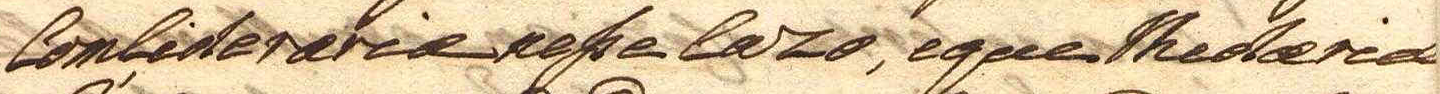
ComÇideraria nesse Cazo, e que lhe daria
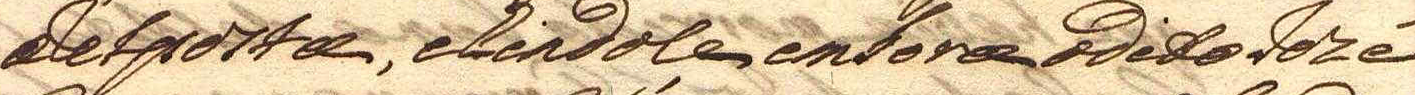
a Resposta, e hindoÇe embora o dito Iozé
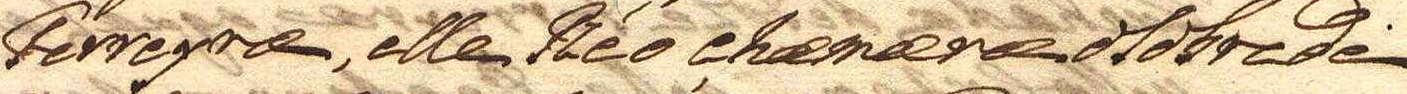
Ferreyra, elle Réo çhamara o sobredi
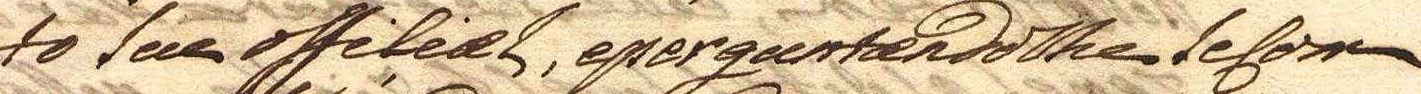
to seu offiÇial, e perguntandolhe se Com
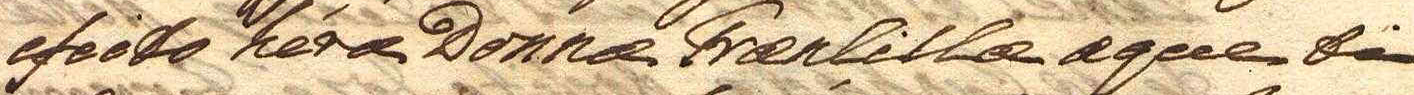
efeito héra Donna FranÇisCa a que ti
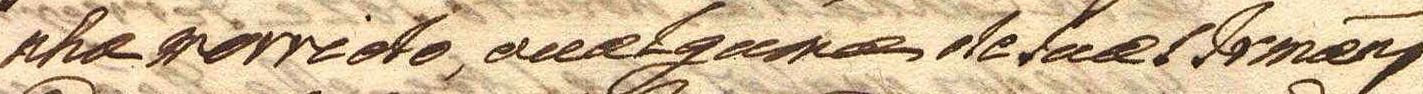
nha morrido, ou alguma de suas Irman̄s
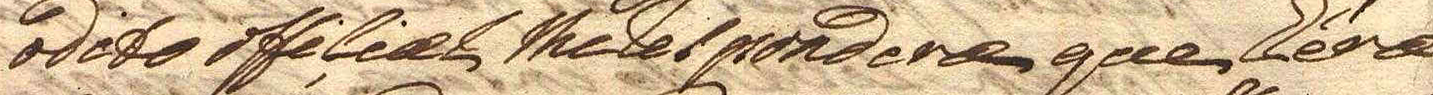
o dito offiÇial lhe Respondera que héra
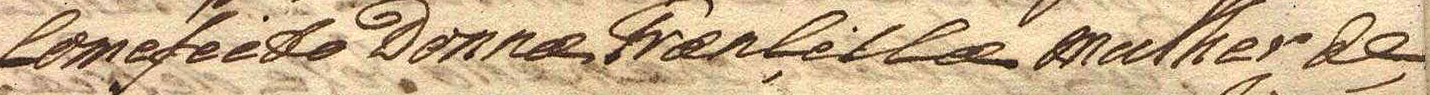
Com efeito Donna FranÇisCa mulher de
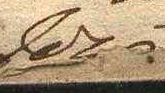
Iozé
